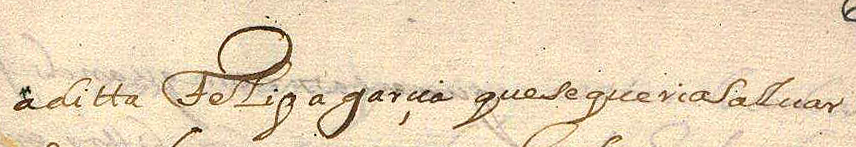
a ditta Felipa garcia que se queria saluar
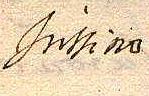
Jnssino
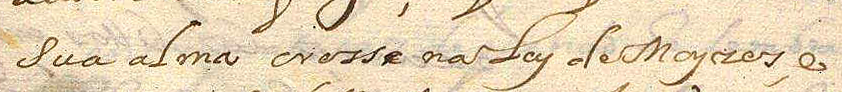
sua alma cresse na Ley de Moyzes, e
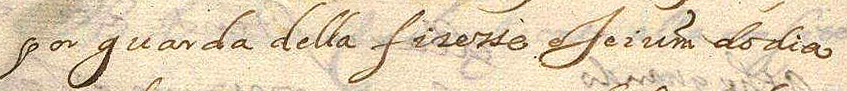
por guarda della fisesse o Jeium do dia
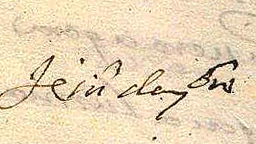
Jejū de 7bro
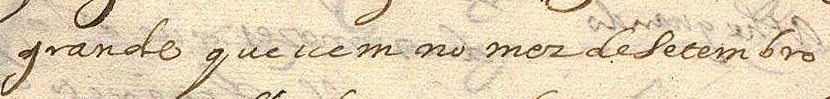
grande que uem no mez de setembro
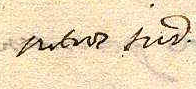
outros ius̄.
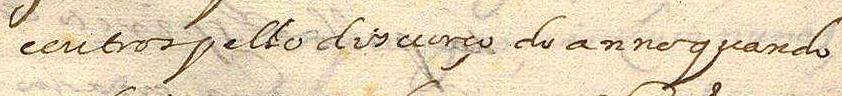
e outros pello discurço do anno quando
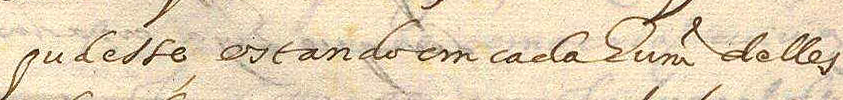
pudesse, estando em cada hum delles
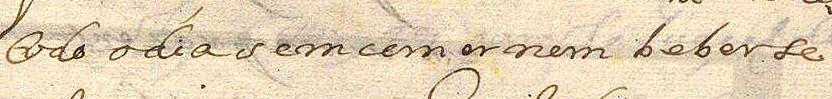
todo o dia sem comer nem beber se
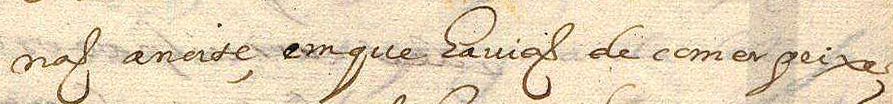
naõ a noite, em que hauiaõ de comer peixe
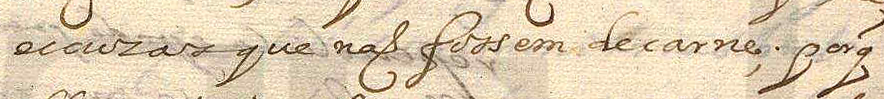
e couzas que naõ fossem de carne, porq̄
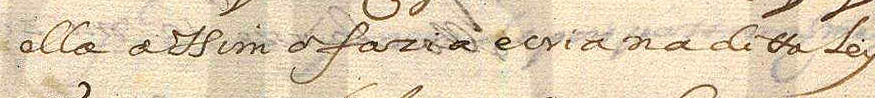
ella assim o fazia e cria na ditta Ley
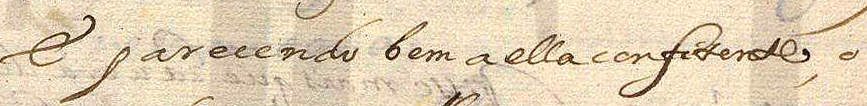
E parecendo bem a ella confitente o
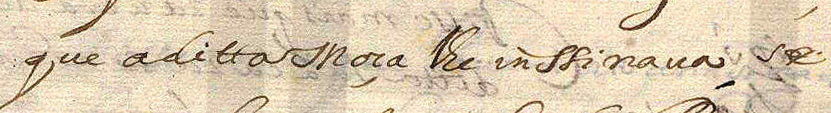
que a ditta Moça lhe insinaua, se
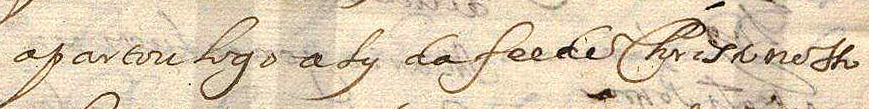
apartou logo aly da fee de Christo nosso
